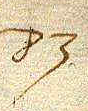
83
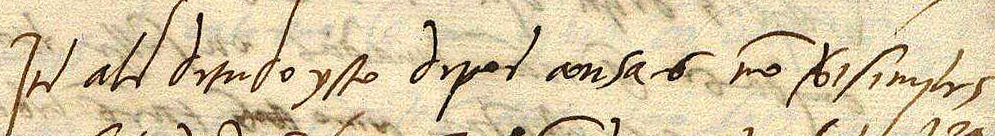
Jtē alē de tudo ysto depoē cousas n̄o ꝟisimjles
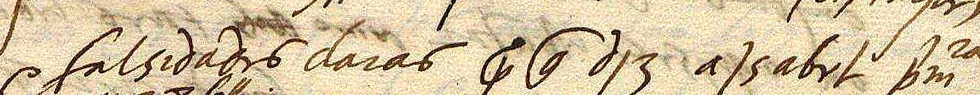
e falsidades claras p̄oq̄ djz a Jsabel pimra
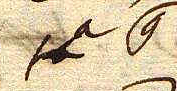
ta q̄
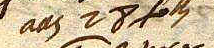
aas 28 folh
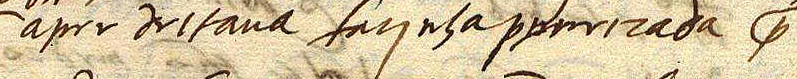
a ree deitaua farjnha pyneirada p̄o
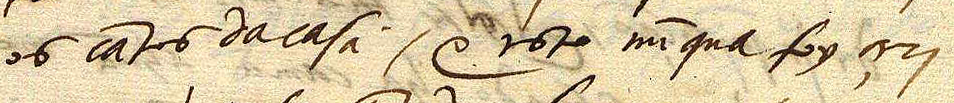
os cātos da casa / e esto nūqua foy cerj
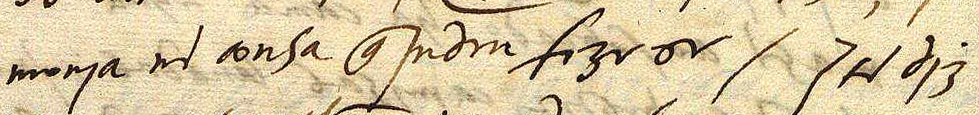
monja nē cousa q̄ Judeu fizese / Jtē djz
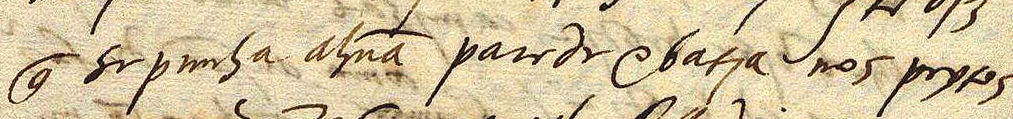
q̄ se punha a huā parede e batja nos peytos
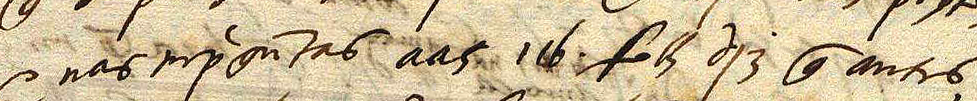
e nas rep̄gūtas aas 116. folh djz q̄ antes
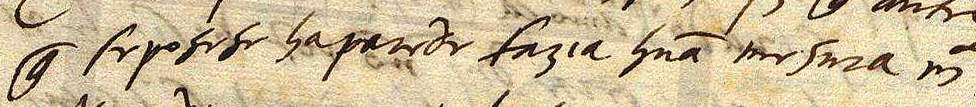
q̄ se posese ha parede fazia huā mesura mto
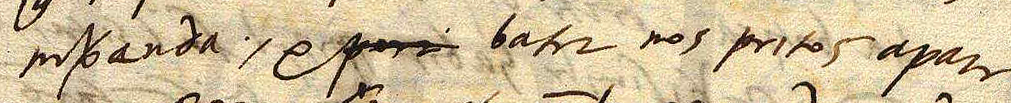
reꝟanda / e pare bater nos peitos a pare
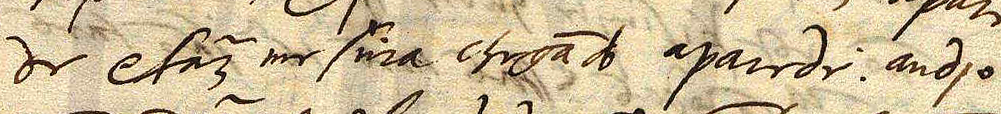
de e faz̄ mesura chegādo a parede: audjo
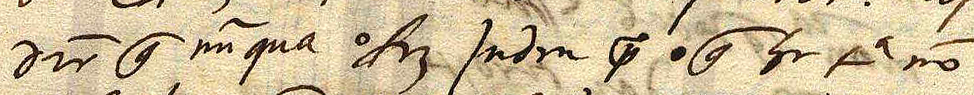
drē q̄ nūqua o fez Judeu p̄o o q̄ he ta nō
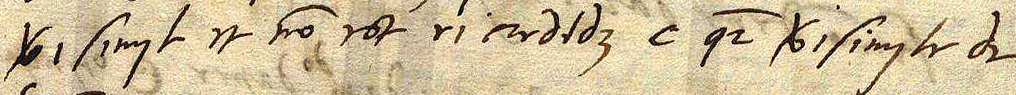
ꝟosimjl et nō est ei credēdꝫ c q̄r ꝟisimjle de
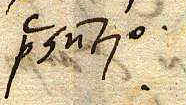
p̄sūtjo.
